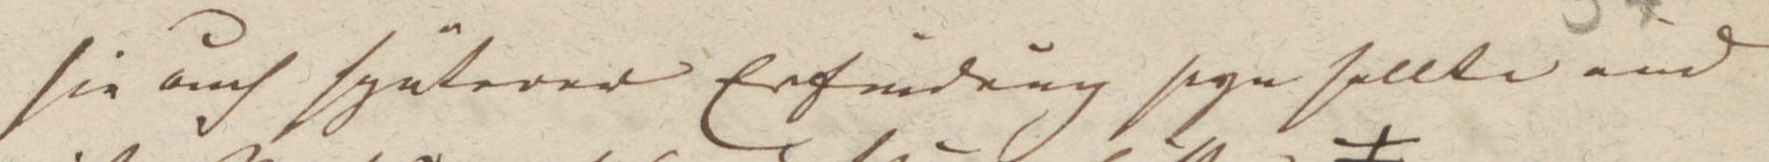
sie auch späterer Erdindung seyn sollte und
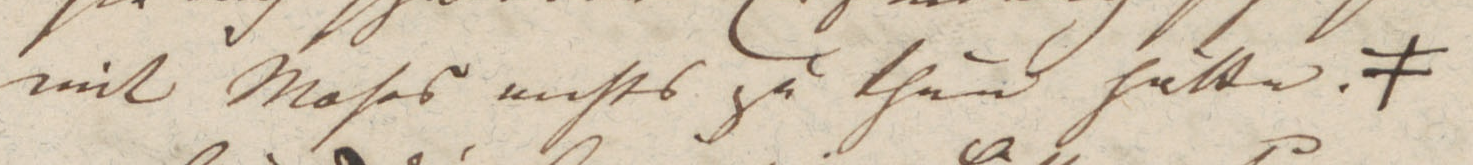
mit Moses nichts zu thun hätte. %
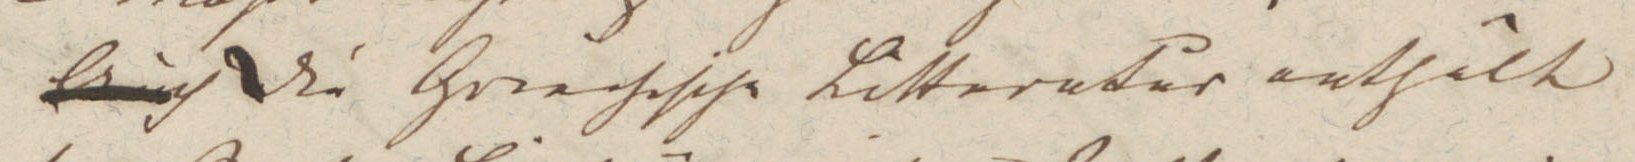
Auch dDie Griechische Litteratur enthält
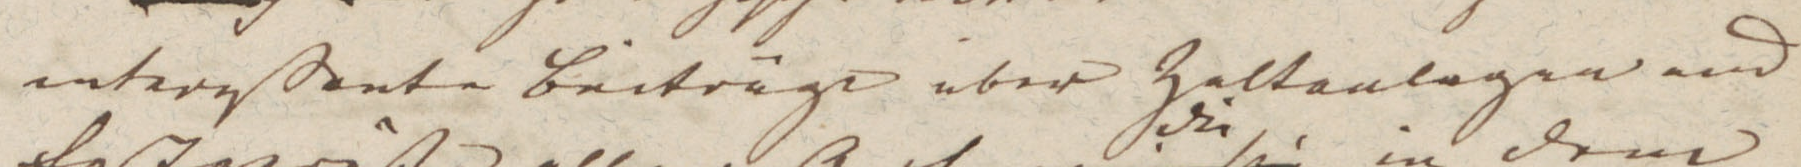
interessante Beiträge über Zeltanlagen und
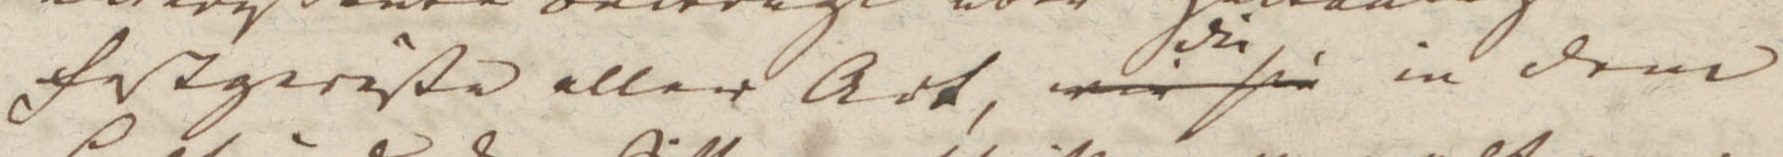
Festgerüste aller Art, wie sie die in dem
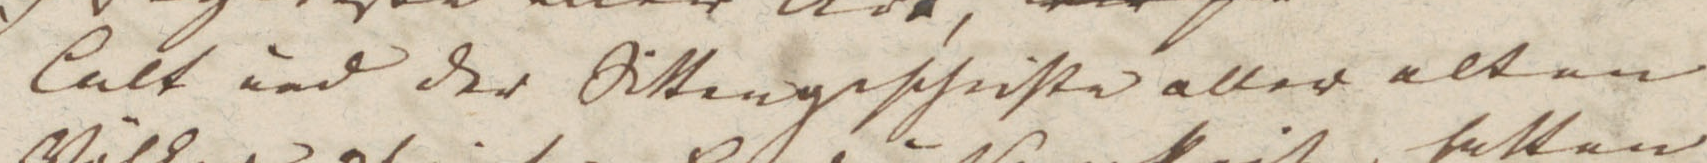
Cult und der Sittengeschichte aller alten
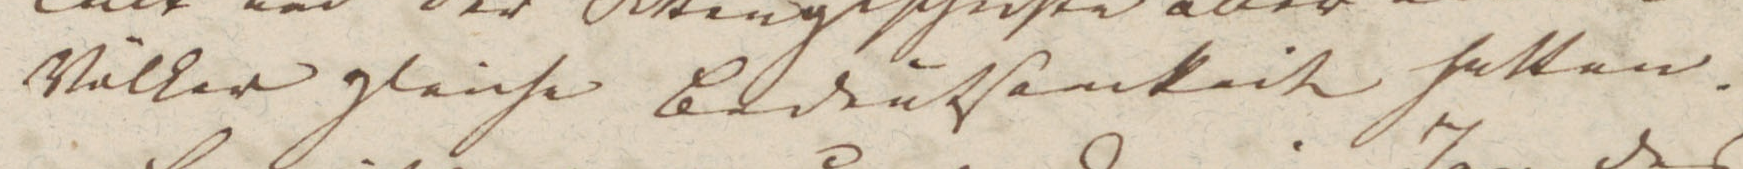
Völker gleiche Bedeutsamkeit hatten.
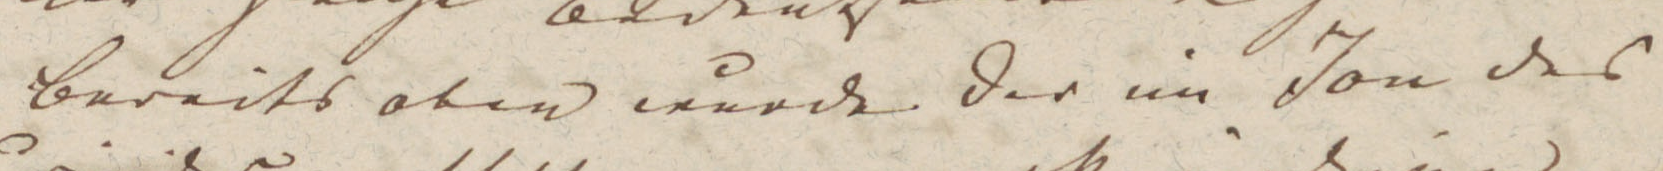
Bereits oben wurde der im Ton des
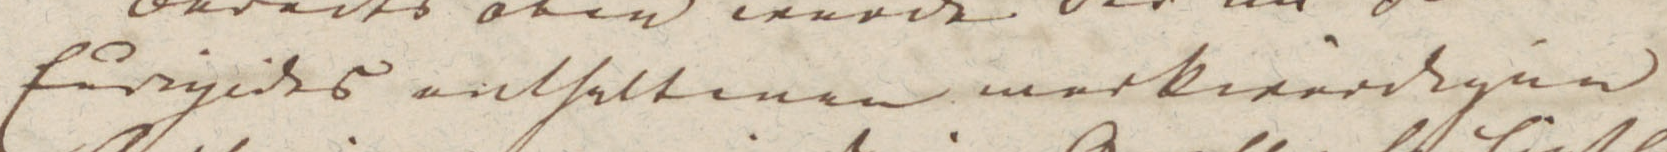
Euripides enthaltenen merkwürdigen
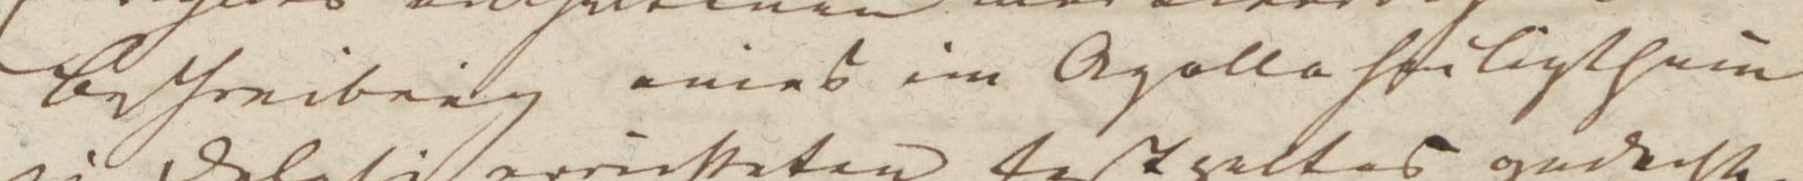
Beschreibung eines im Apolloheiligthum
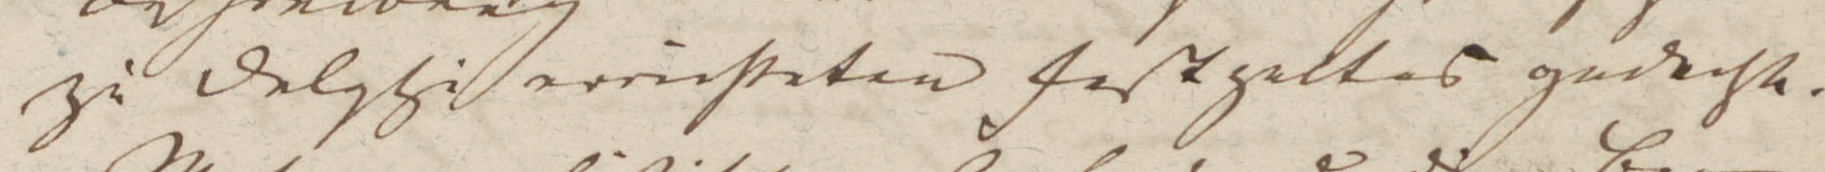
zu Delphi verrichteten Festzeltes gedacht.
